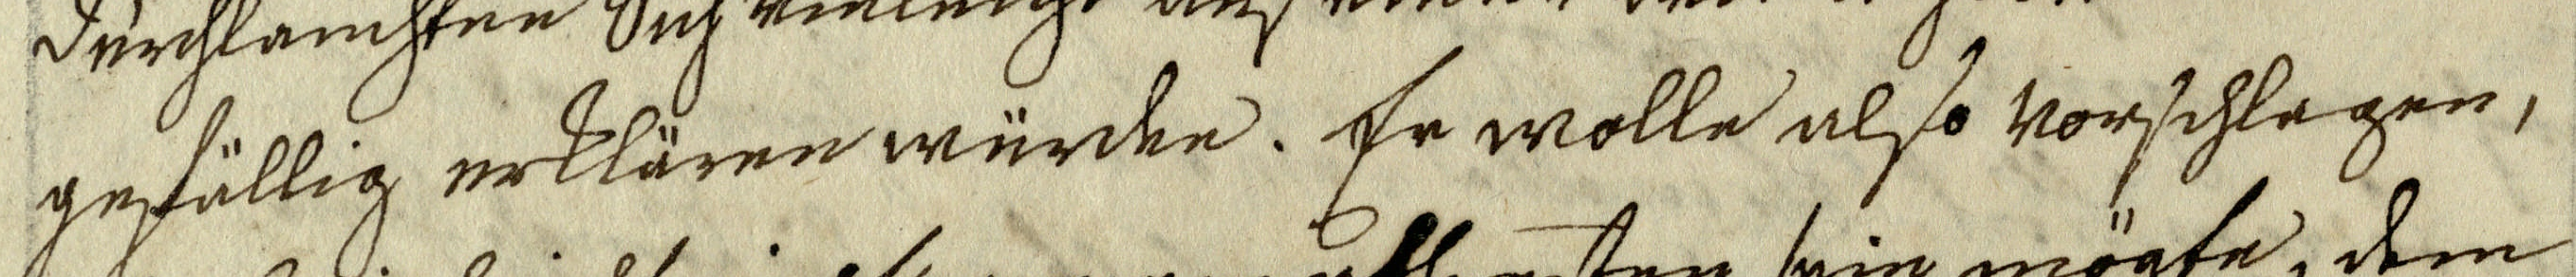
gefällig erklären würden. Er wolle also vorschlagen,
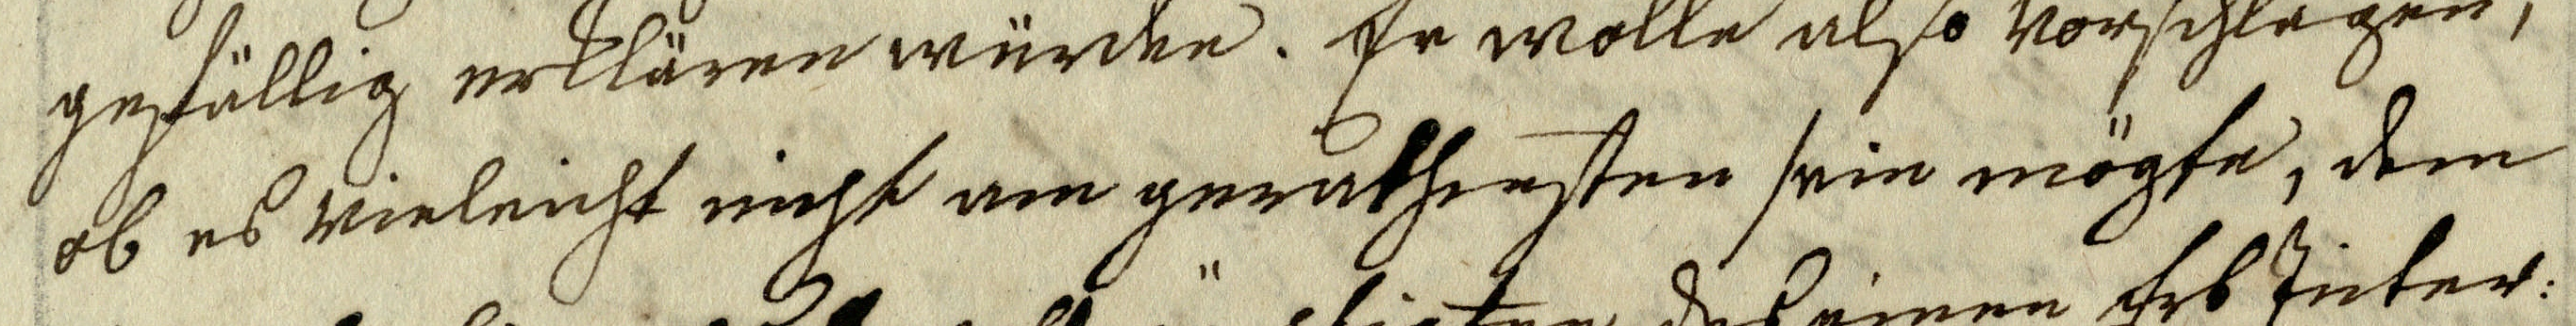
ob es vieleicht nicht am gerathensten sein mögte, dem
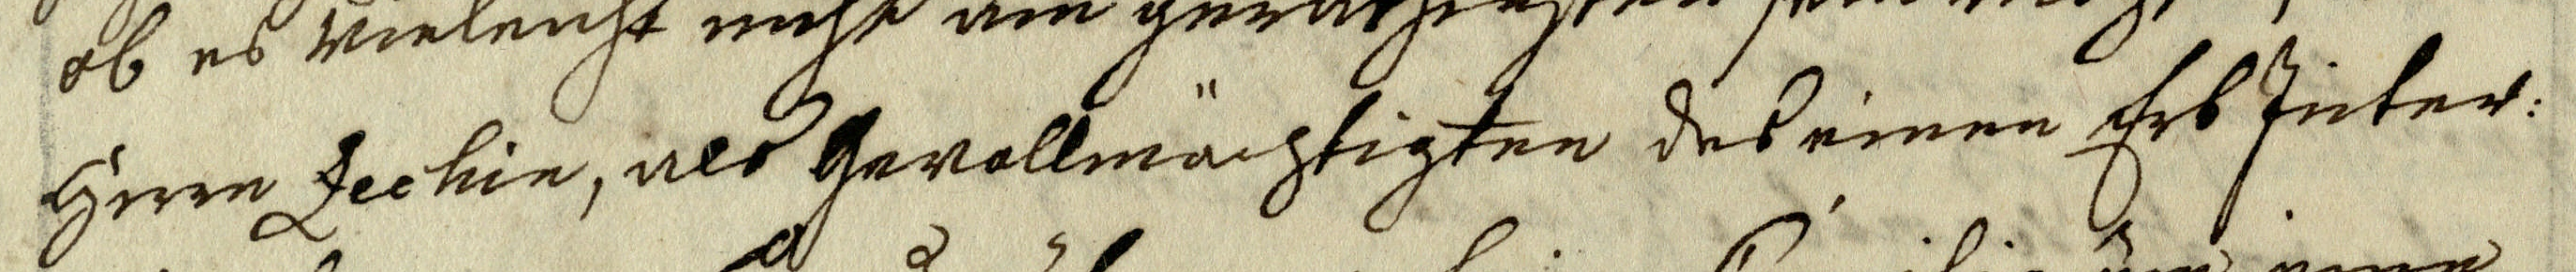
Herrn Zechin, als Gevollmächtigten des einen Erb Inter¬
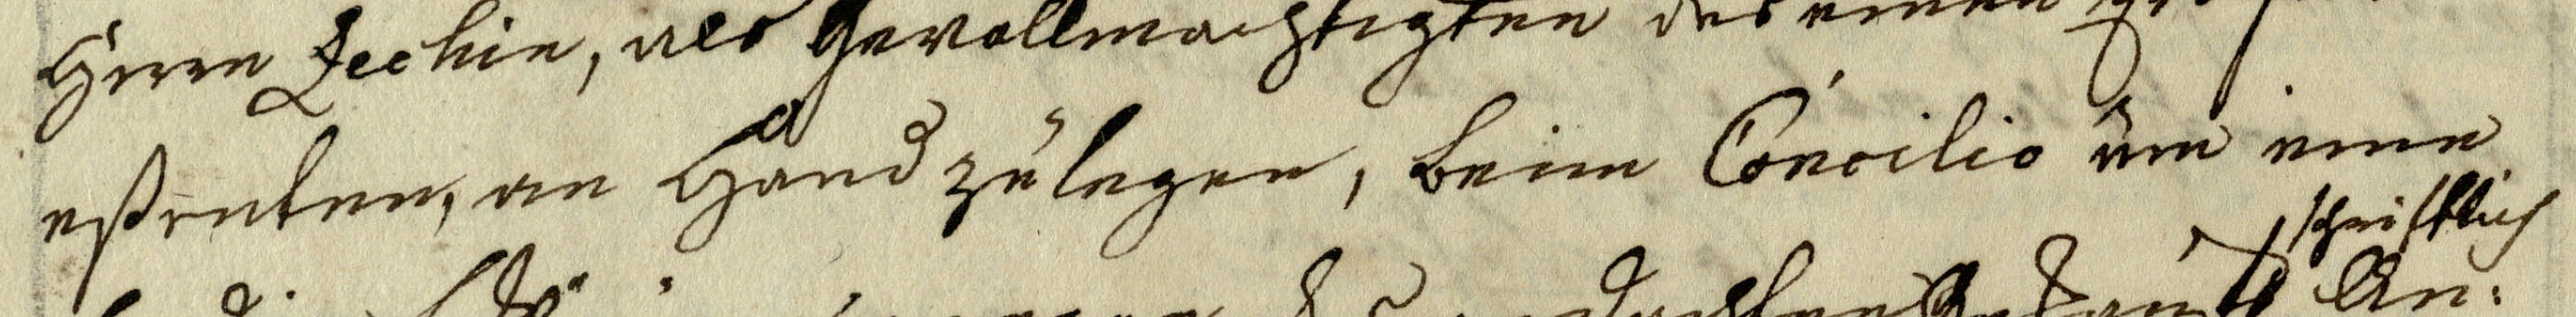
eßenten, an Hand zu legen, beim Concilio um eine
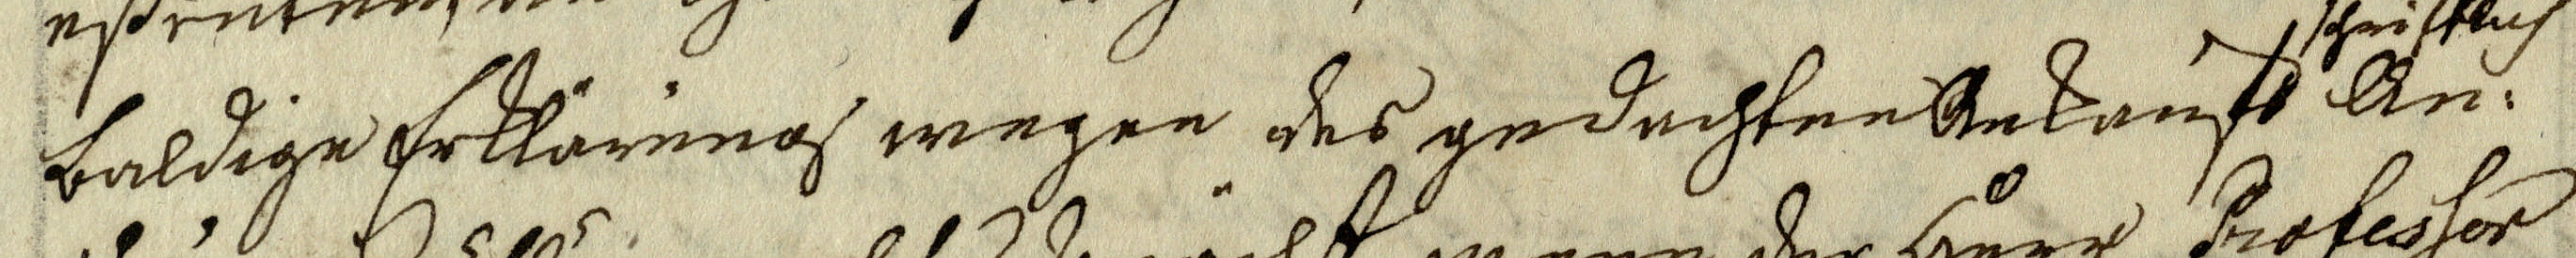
baldige Erklärung wegen des gedachten Ankaufs schriftlich An¬
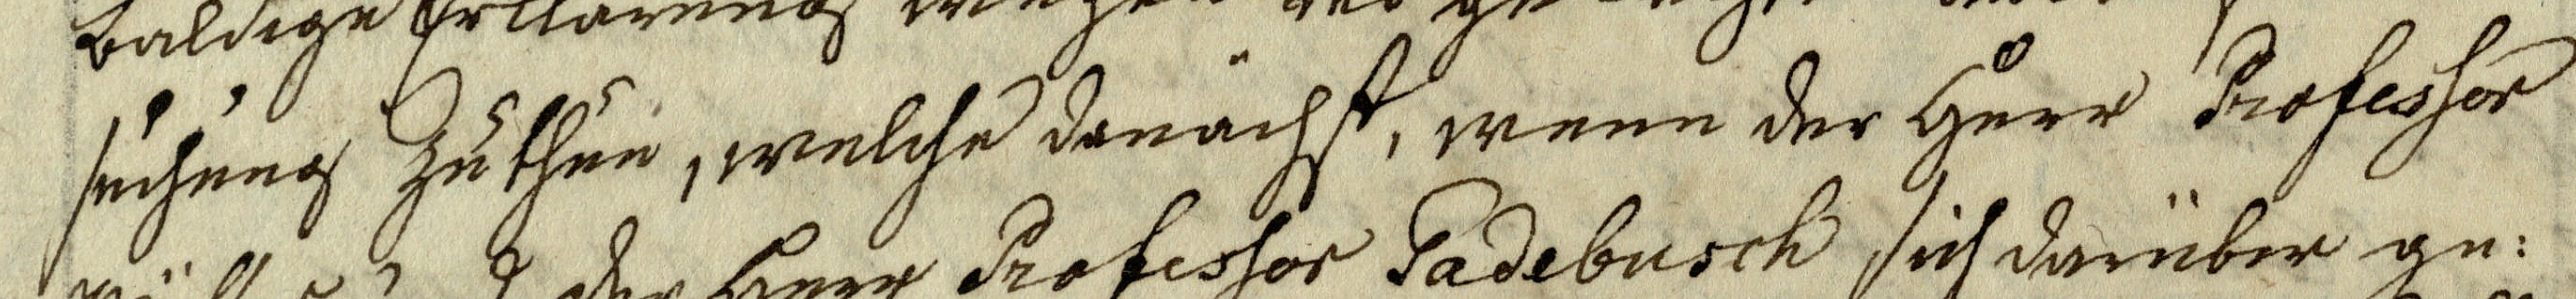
suchung zu thun, welche danächst, wenn der Herr Professor
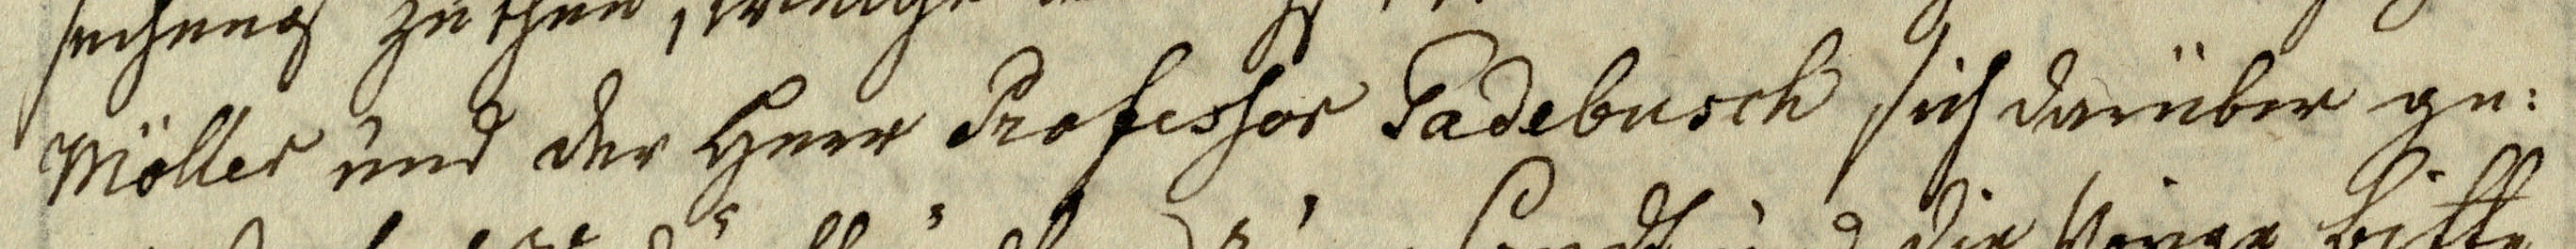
Möller und der Herr Professor Gadebusch sich darüber ge¬
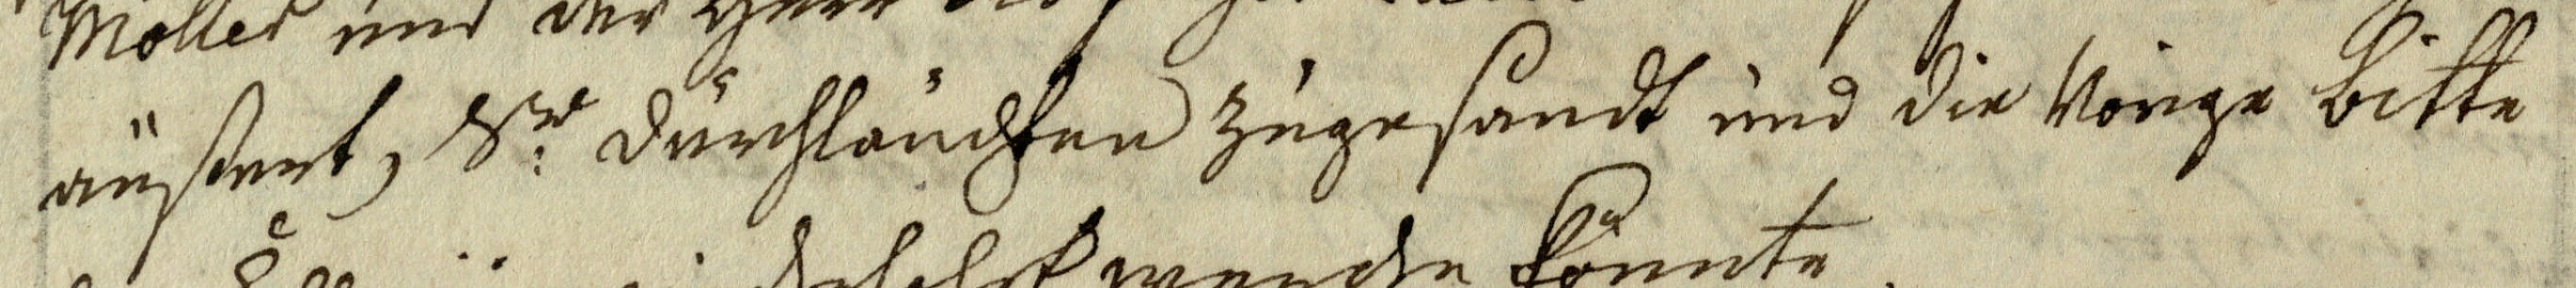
äußert, Sr. Durchlauchten zugesandt und die vorige Bitte
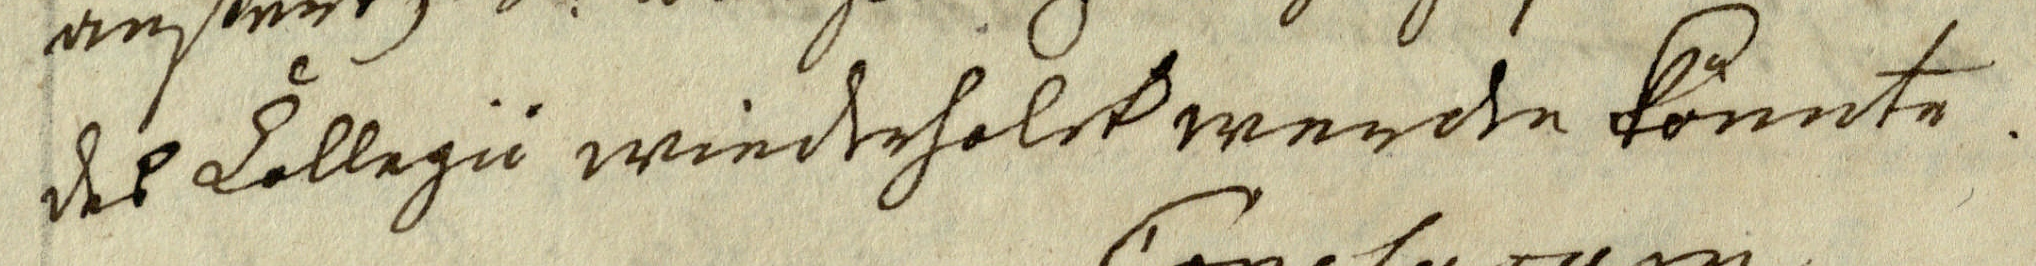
des Collegii wiederholet werden könnte.
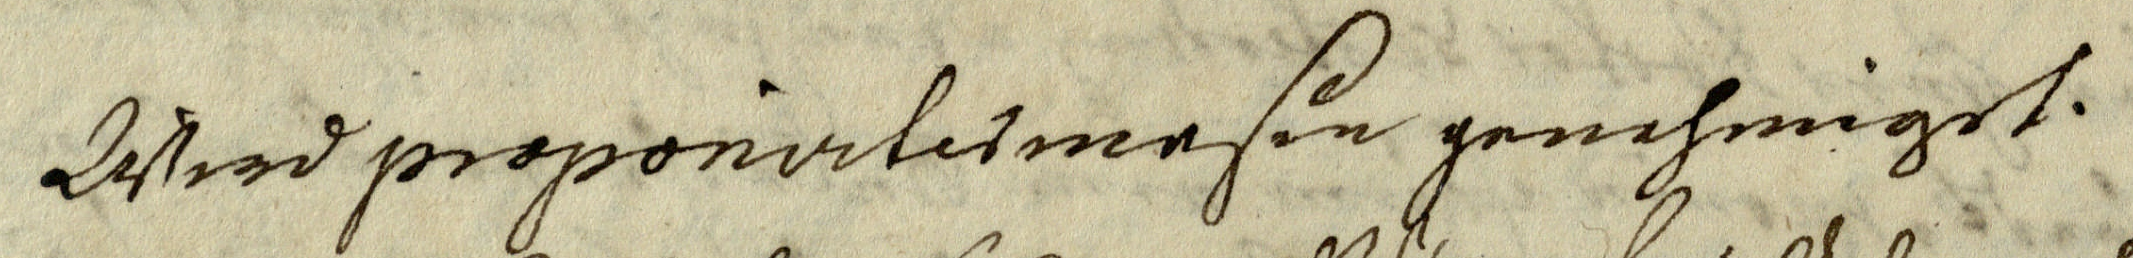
Wird proponirtermaßen genehmiget.
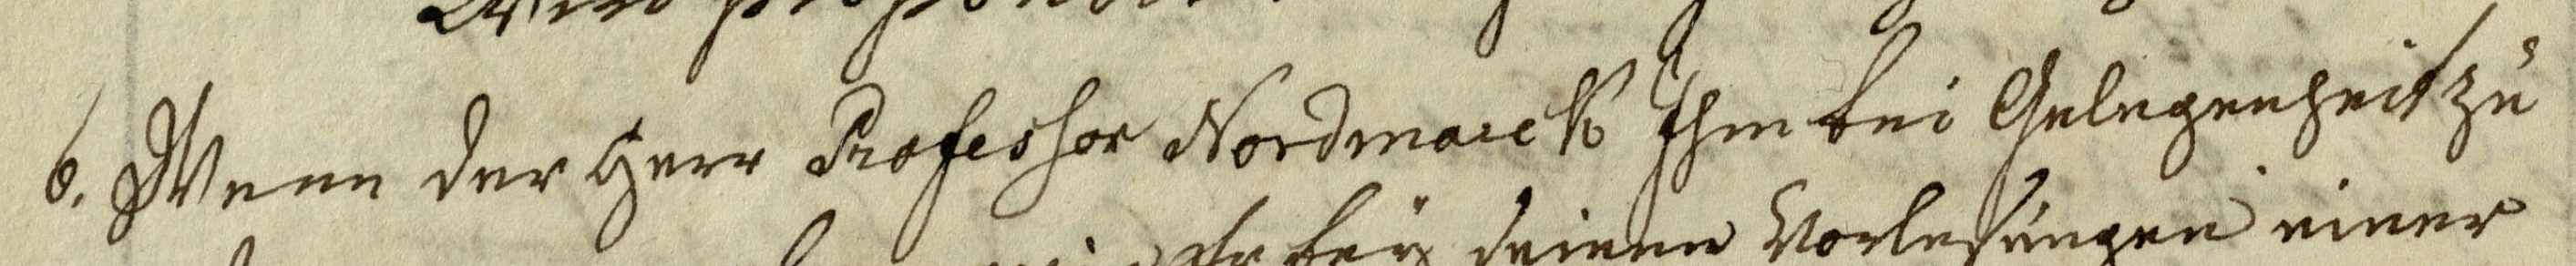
6. Wenn der Herr Professor Nordmarck Ihm bei Gelegenheit zu
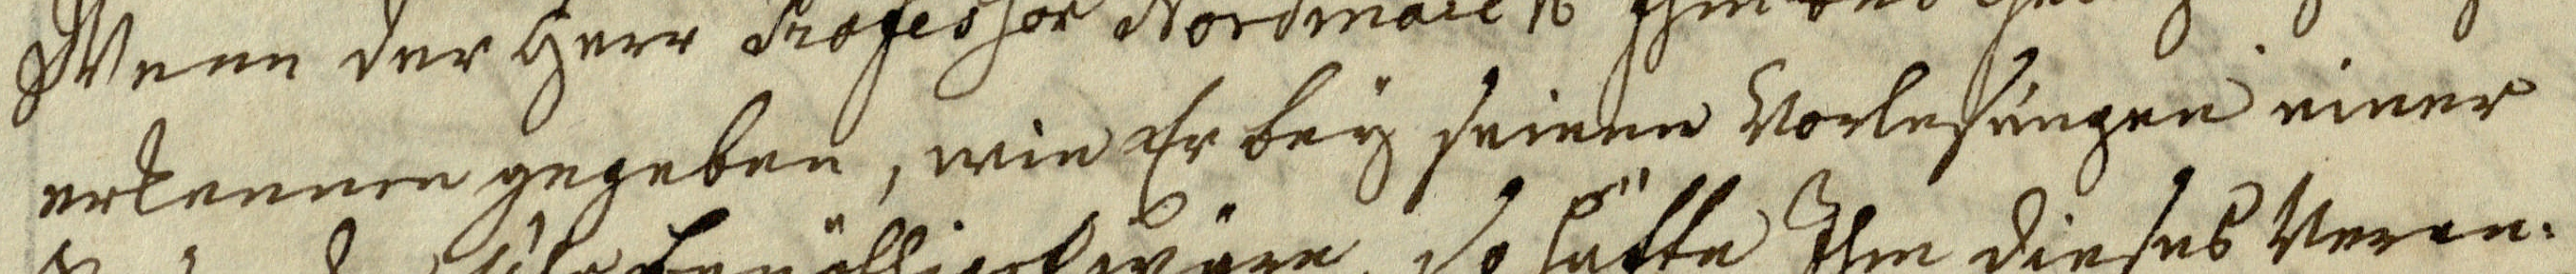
erkennen gegeben, wie Er beÿ seinen Vorlesungen einer
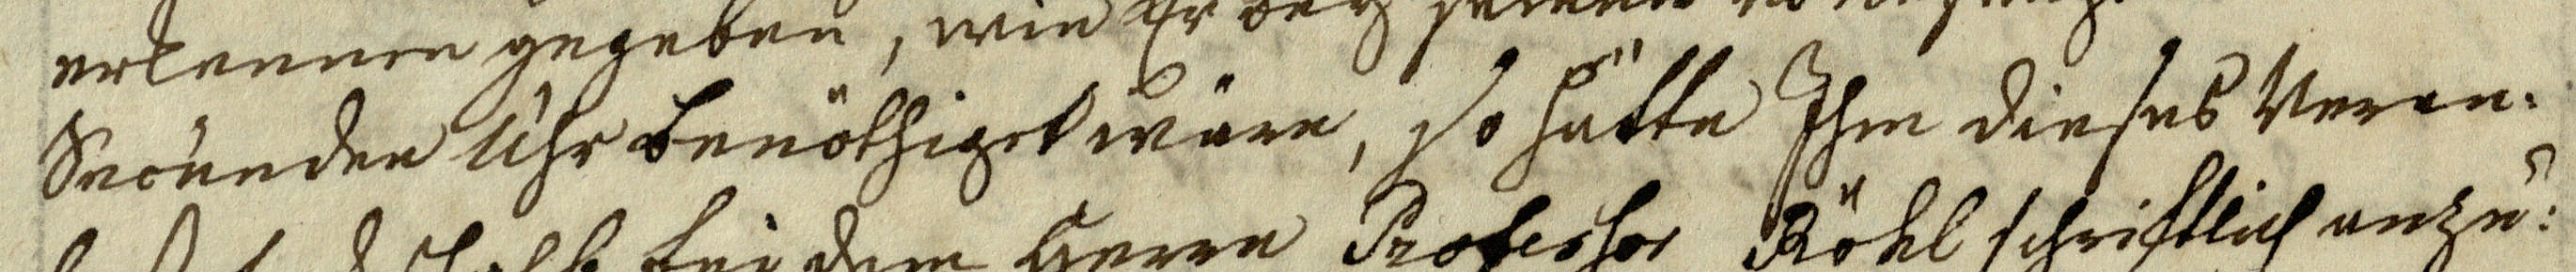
Secunden Uhr benötiget wäre, so hätte Ihm dieses veran¬
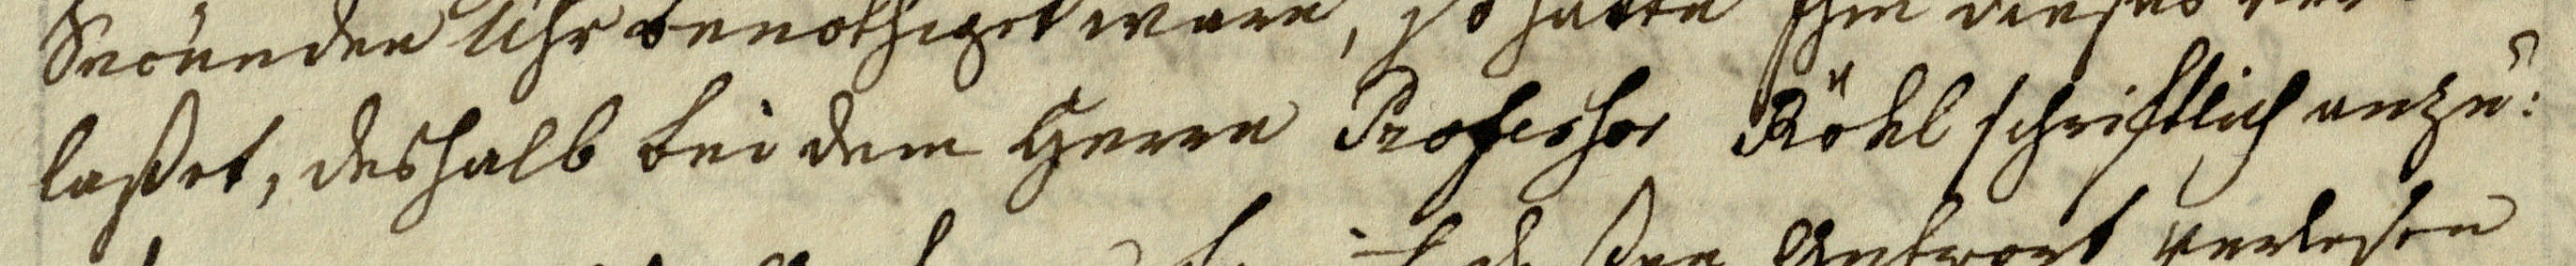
laßet, deshalb bei dem Herrn Professor Röhl schriftlich anzu¬
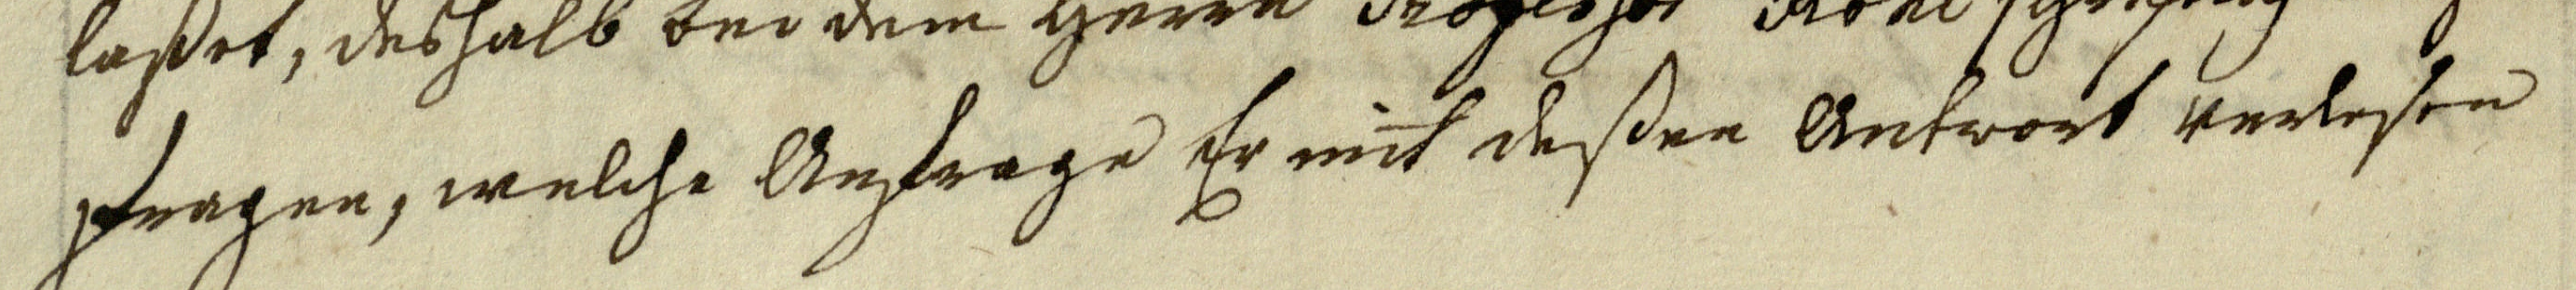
fragen, welche Anfrage Er mit deßen Antwort verlesen
